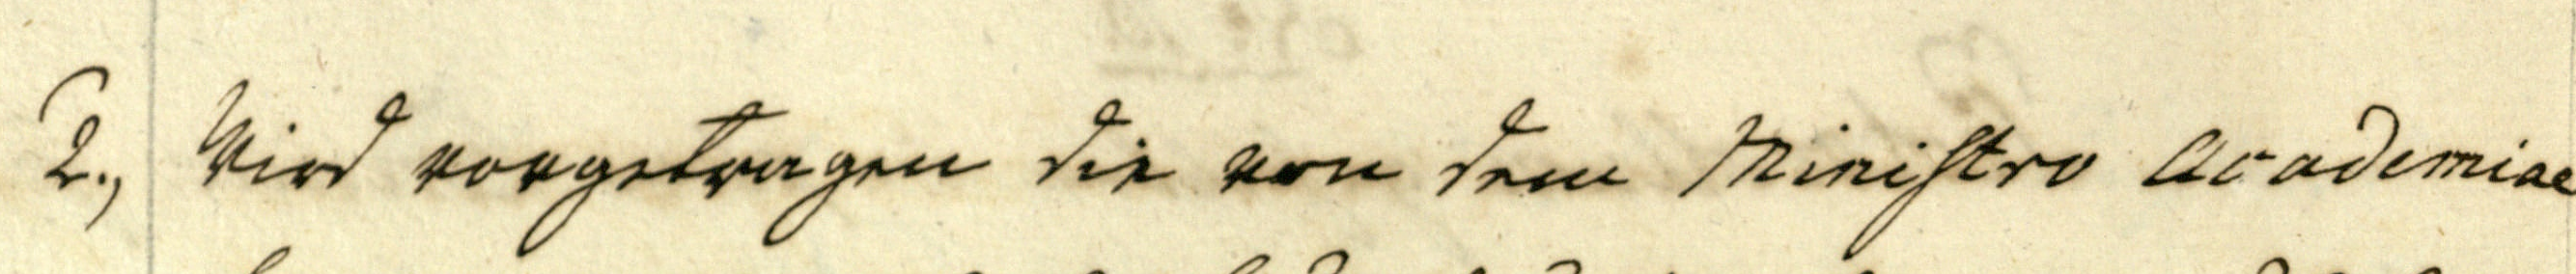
2., Wird vorgetragen die von dem Ministero Academiae
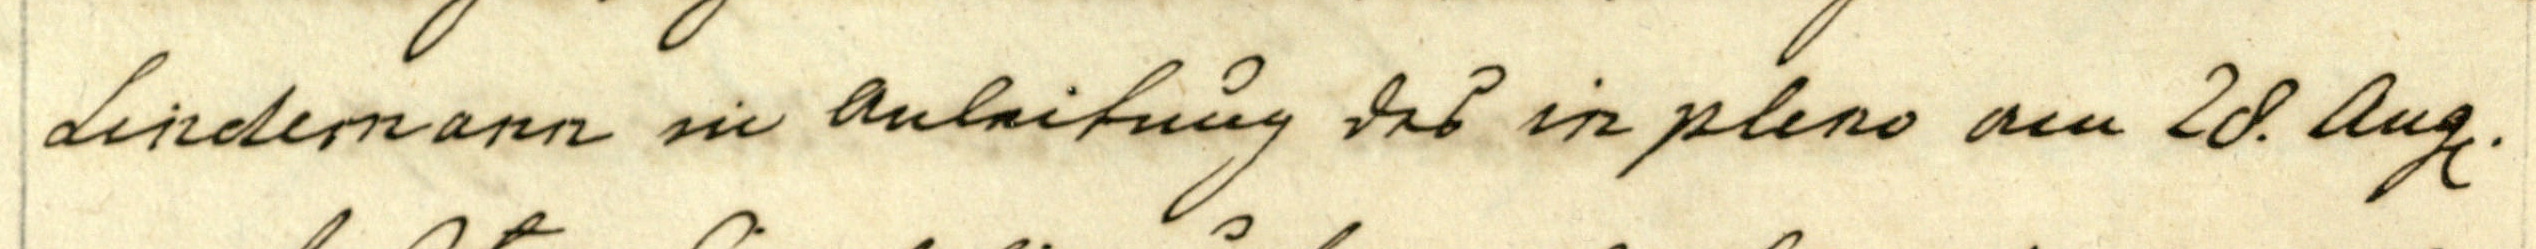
Lindemann in Anleitung des in pleno am 28. Aug.
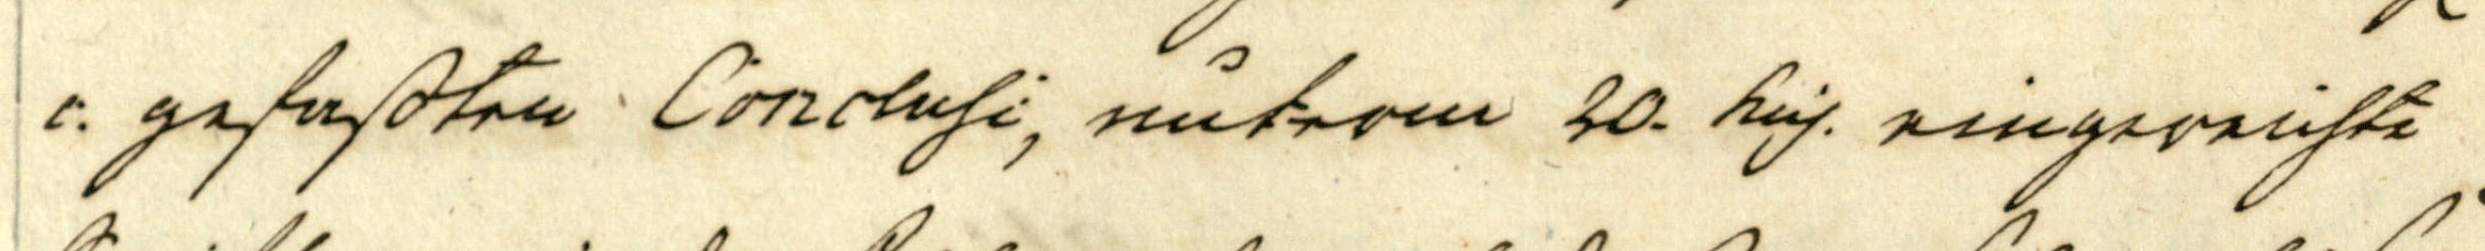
c. gefaßten Conclusi, unterm 20. huj. eingereichte
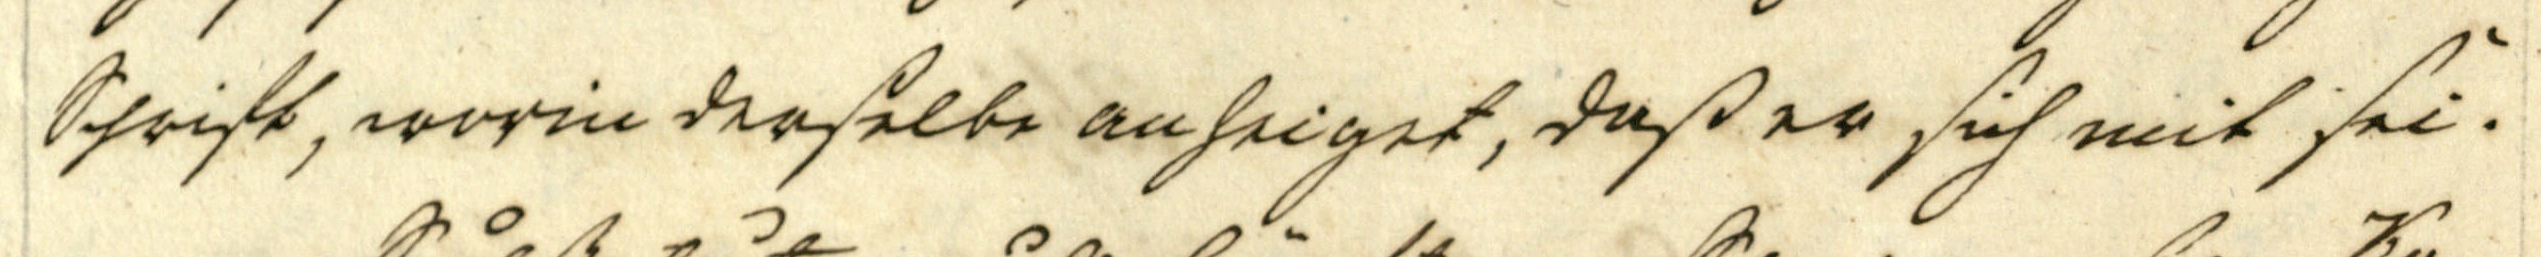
Schrift, worin derselbe anzeiget, daß er sich mit sei¬
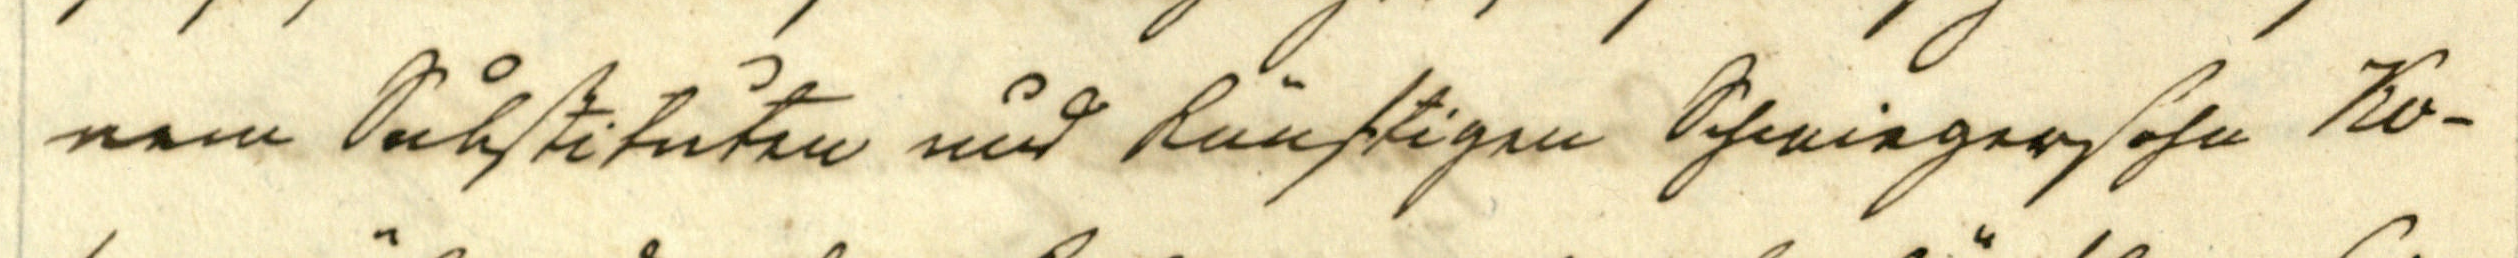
nem Substituten und künftigen Schwiegersohn Ko¬
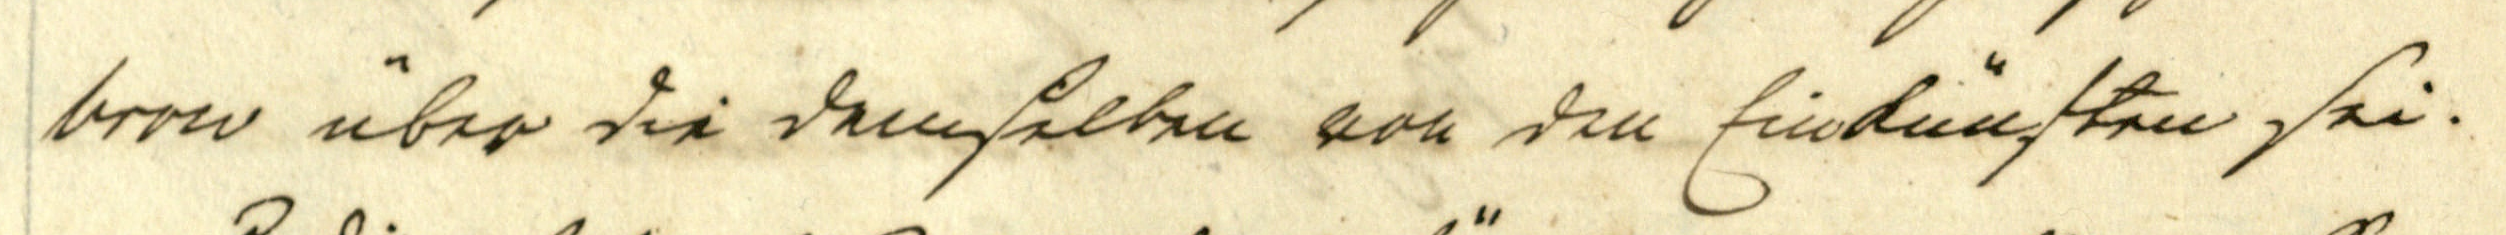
brow über die demselben von den Einkünften sei¬
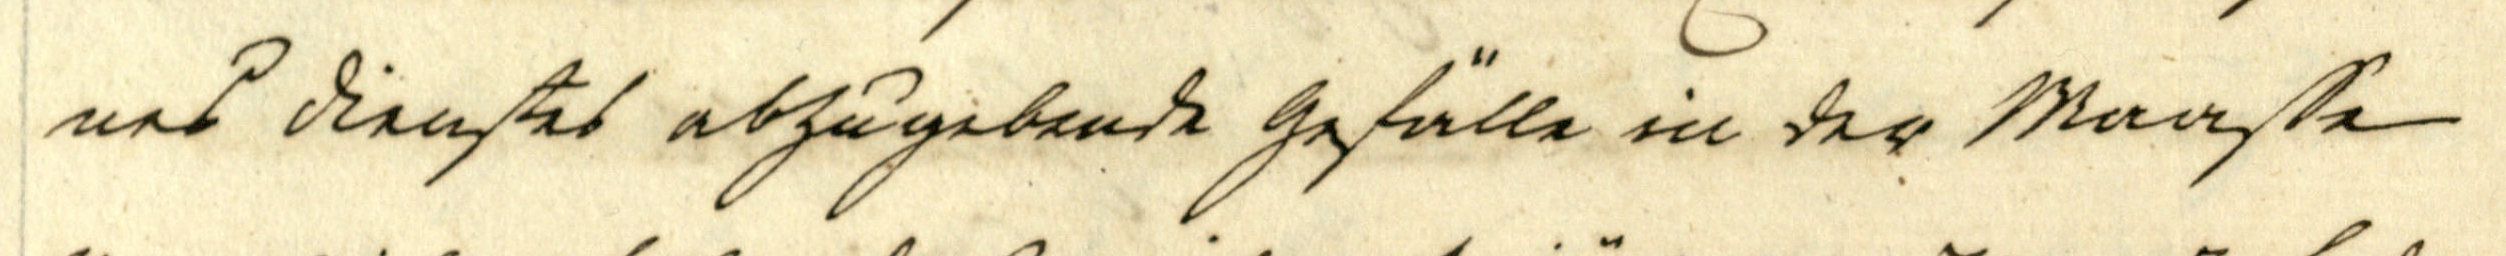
es Dienstes abzugebende Gefälle in der Maasse
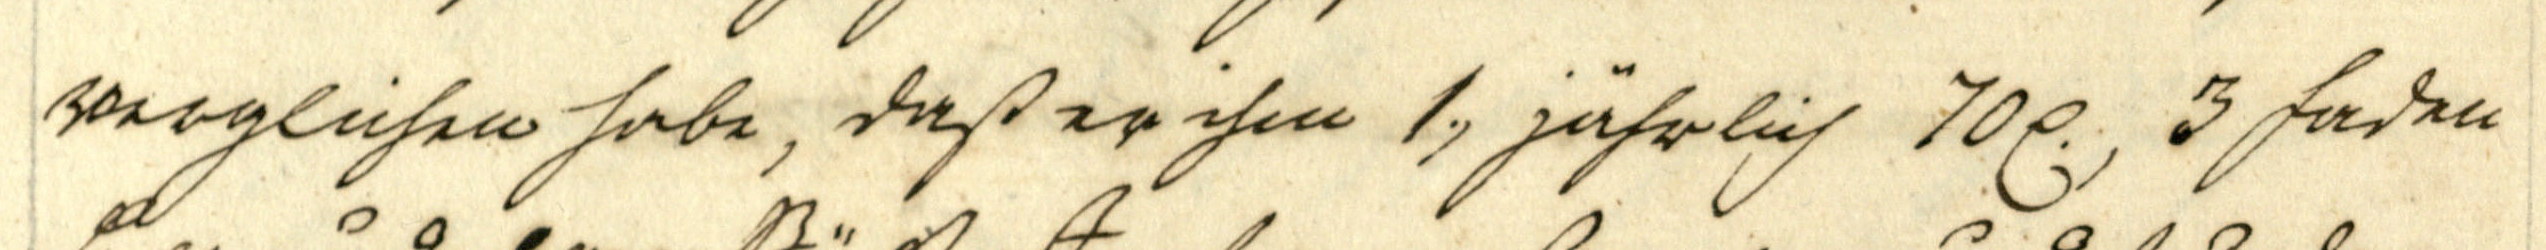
verglichen habe, daß er ihm 1, jährlich 70 l. 3 Faden
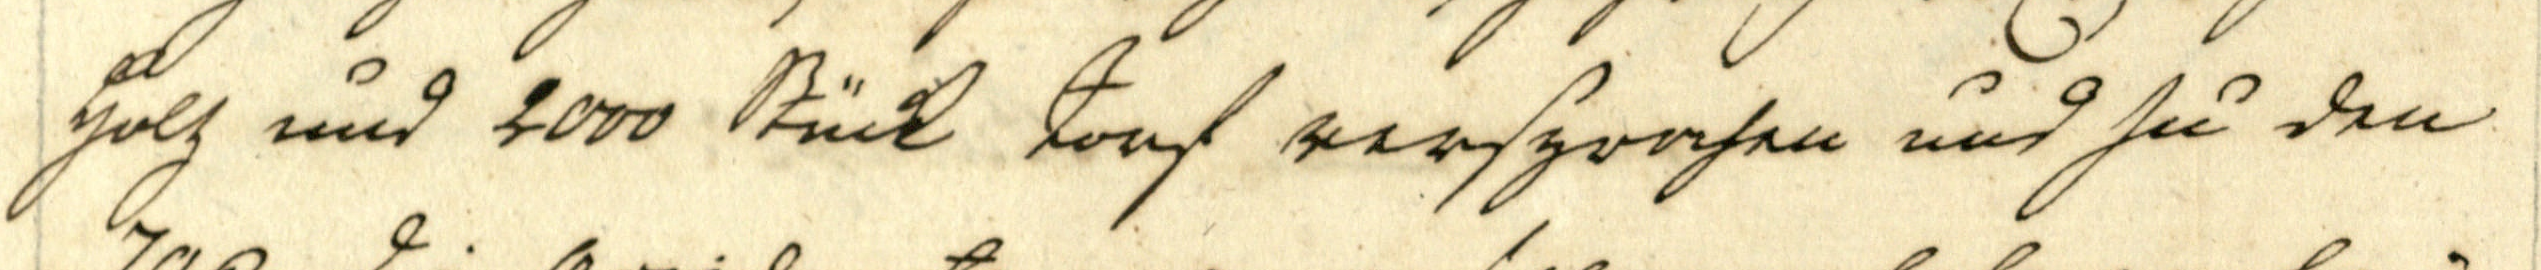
Holz und 2000 Stück Torf versprochen und zu den
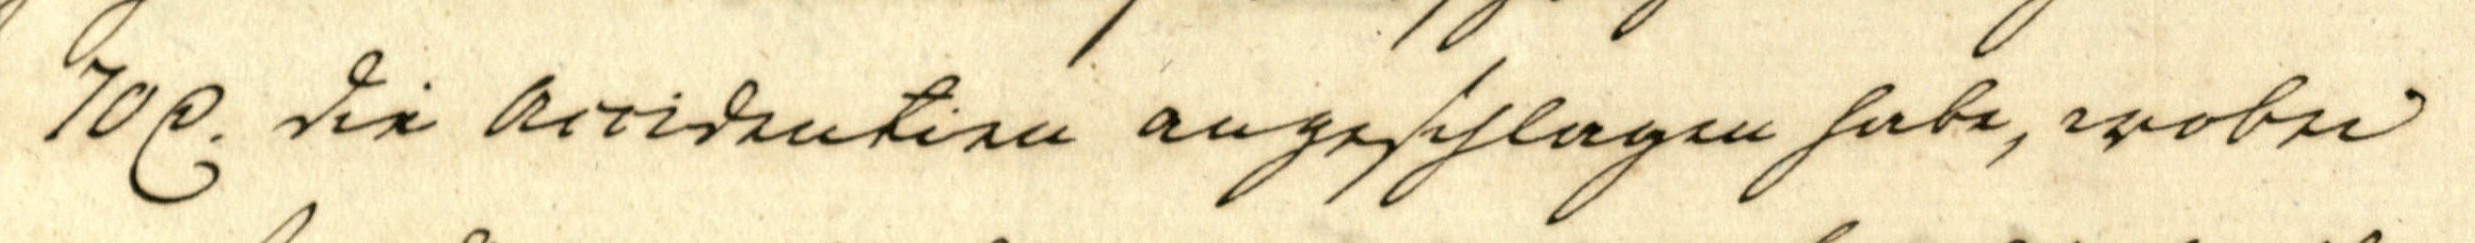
70 l. die Accidentien angeschlagen habe, wobei
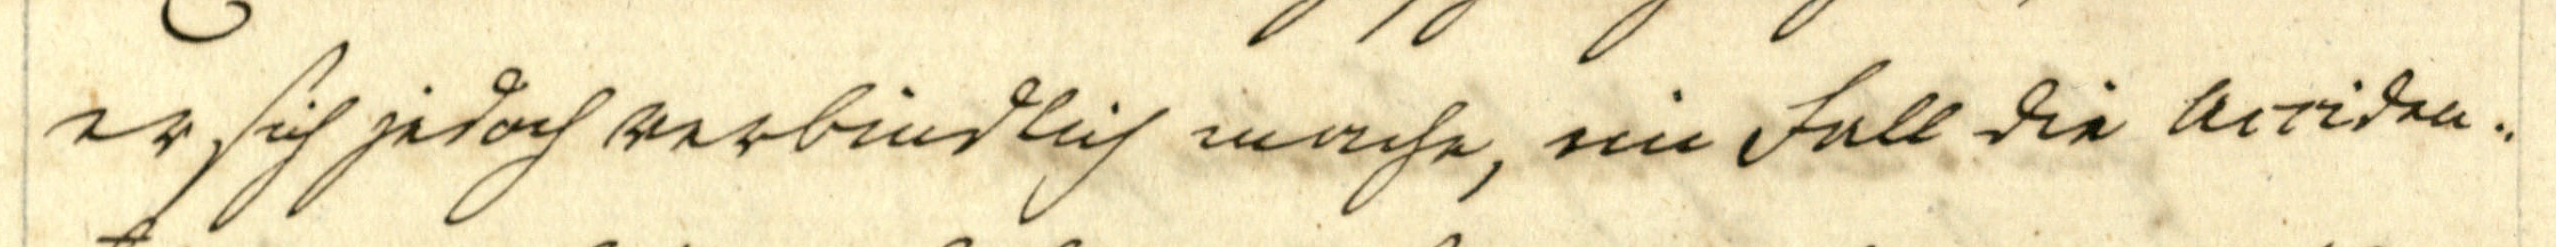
er sich jedoch verbindlich mache, im Fall die Acciden¬
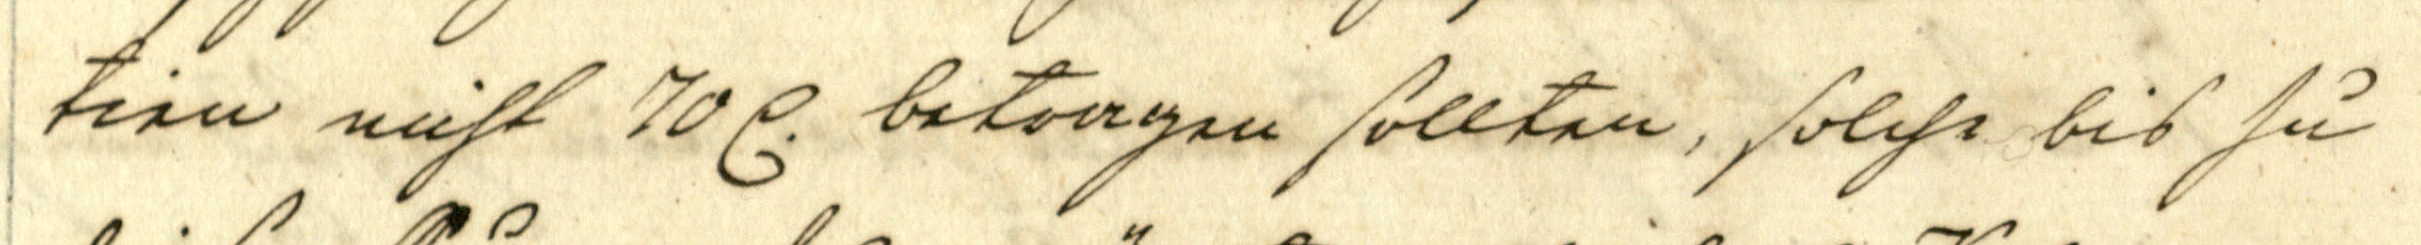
tien nicht 70 l. betragen sollten, solche bis zu
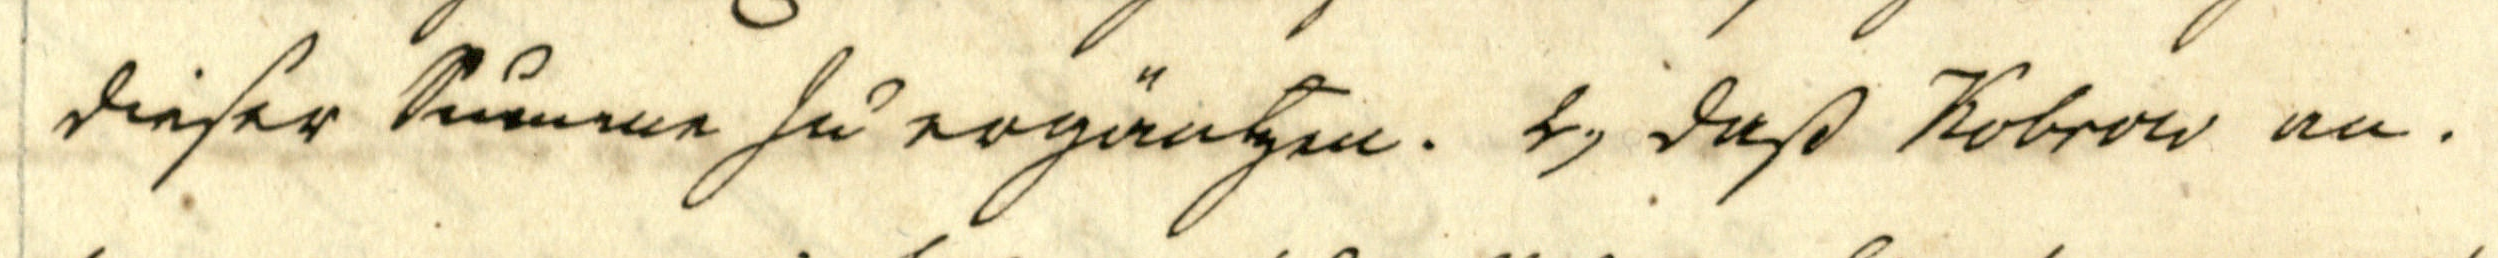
dieser Summe zu ergäntzen. 2., daß Kobrow an¬
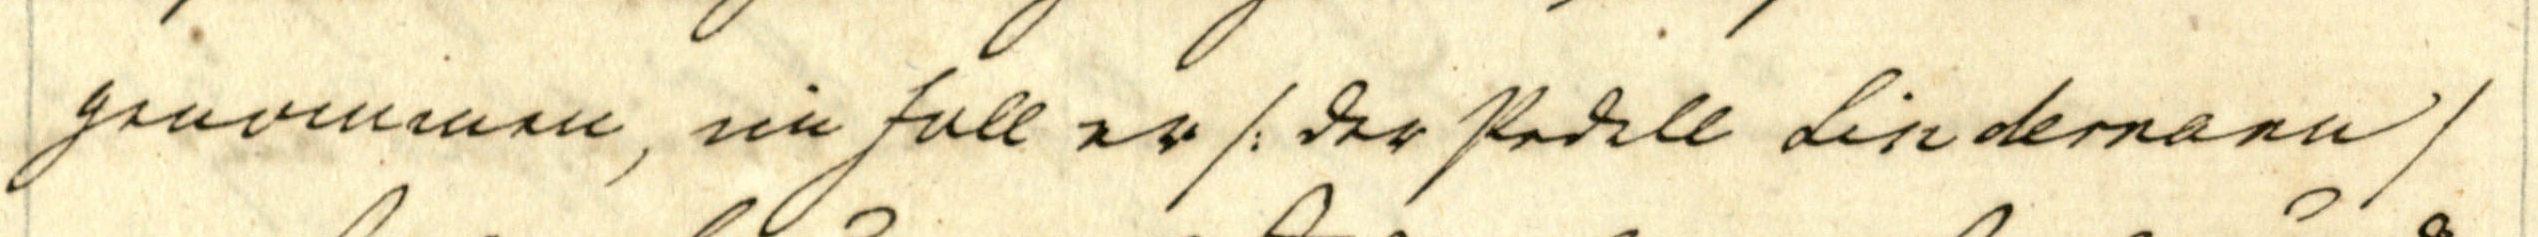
genommen, im Fall er /. der Pedell Lindemann/
